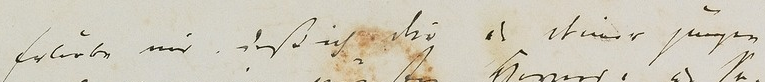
Erlaube mir, daß ich dir u. deiner jungen
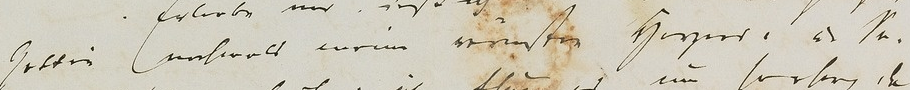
Gattin nochmals meine wärmsten Herzens- u. Se-
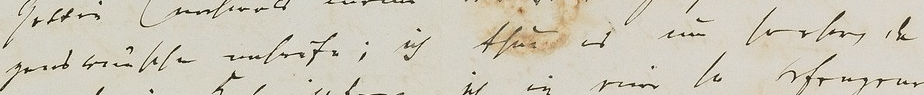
genswünsche nachrufe; ich thue es um so eher, da
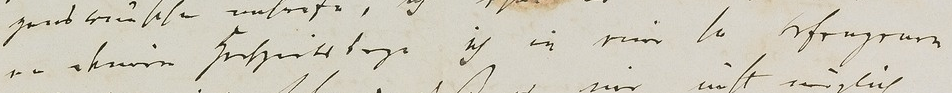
an deinem Hochzeitstage ich in einer so befangenen
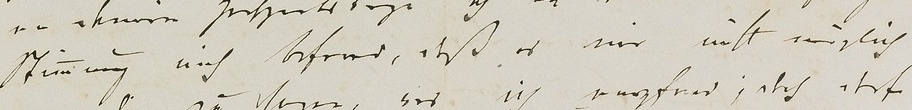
Stimmung mich befand, daß es mir nicht möglich
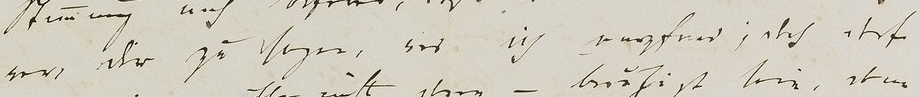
war, dir zu sagen, was ich empfand; doch darf
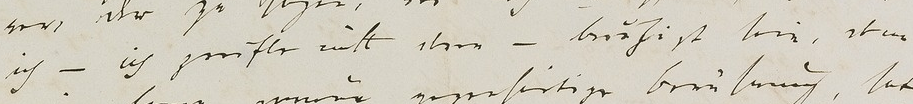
ich – ich zweifle nicht dran – beruhigt sein, denn
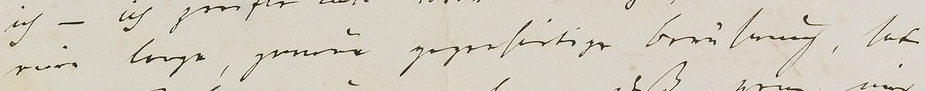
eine lange, genaue gegenseitige Berührung, hat
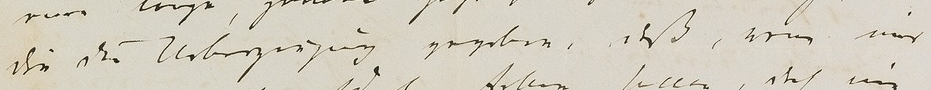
dir die Ueberzeugung gegeben, daß, wenn mir
